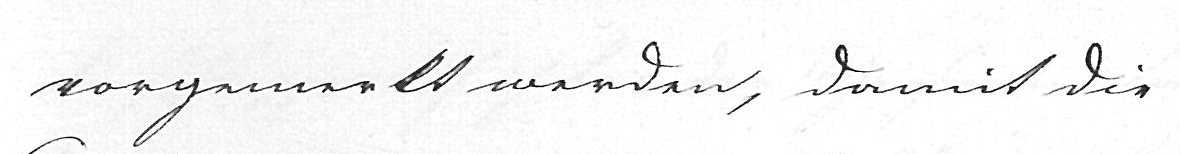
vorgemerkt werden, damit die
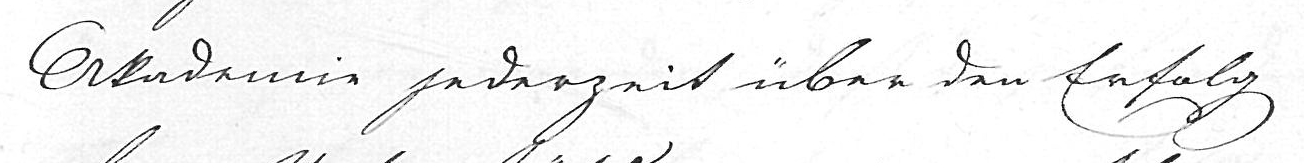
Akademie jederzeit über den Erfolg
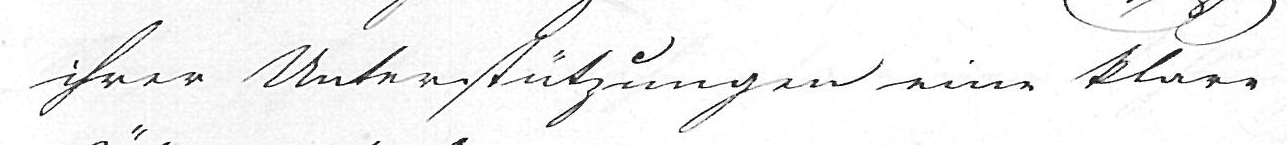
ihrer Unterstützungen eine klare
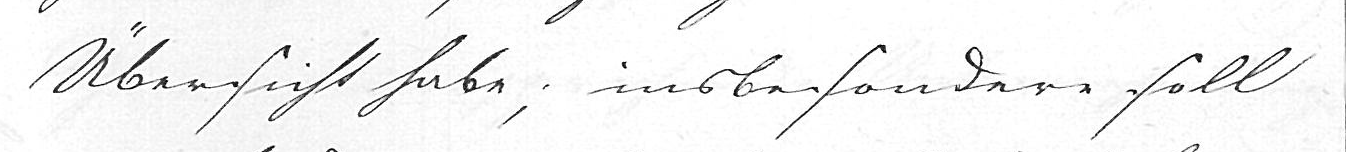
Übersicht habe; insbesondere soll
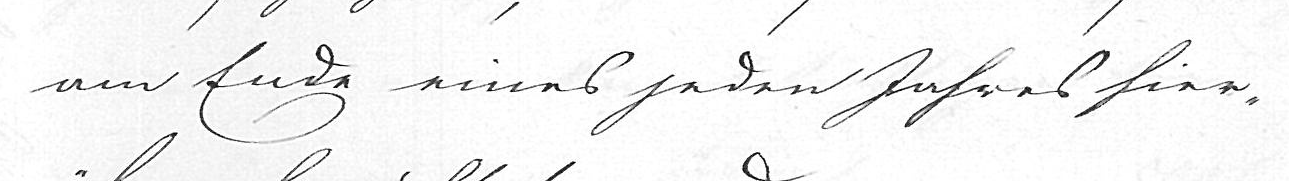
am Ende eines jeden Jahres hier-
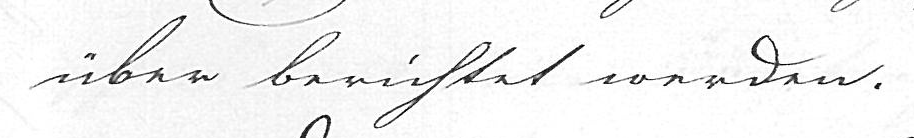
über berichtet werden.
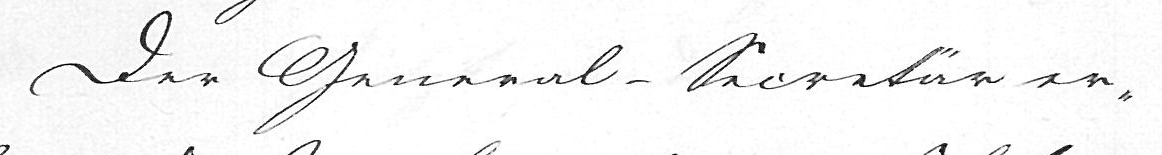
Der General-Secretär er-
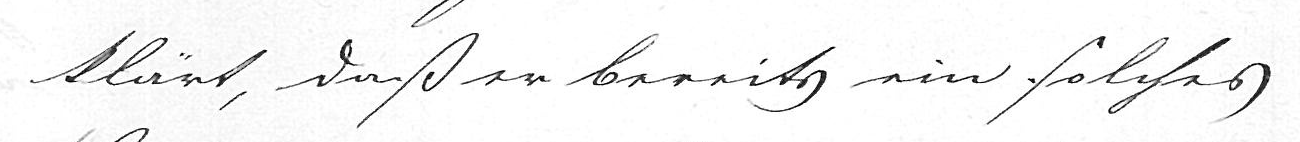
klärt, daß er bereits ein solches
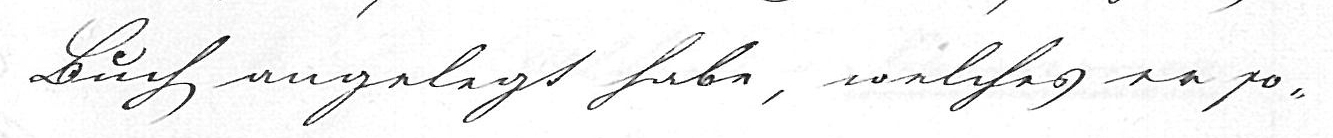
Buch angelegt habe, welches er so-
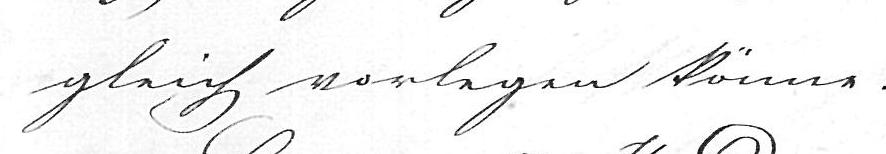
gleich vorlegen könne.
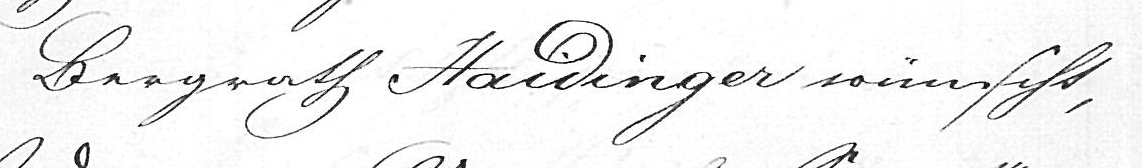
Bergrath Haidinger wünscht,
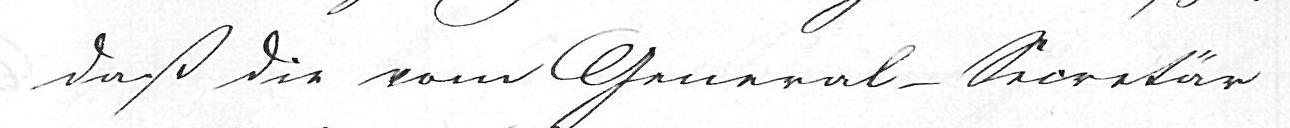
daß die vom General-Secretär
